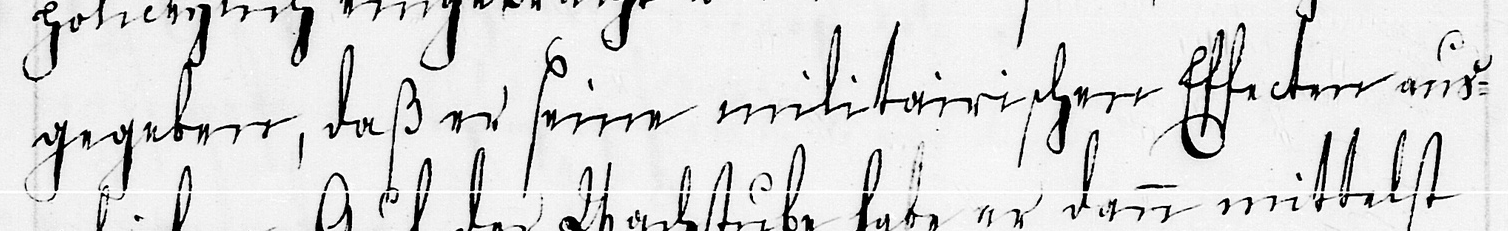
gegeben, daß er seine militairischen Effecten aus¬
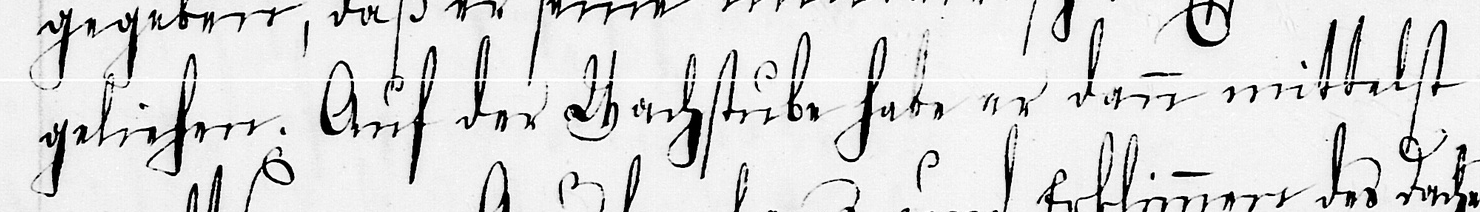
geliehen. Auf der Wachstube habe er dann mittelst
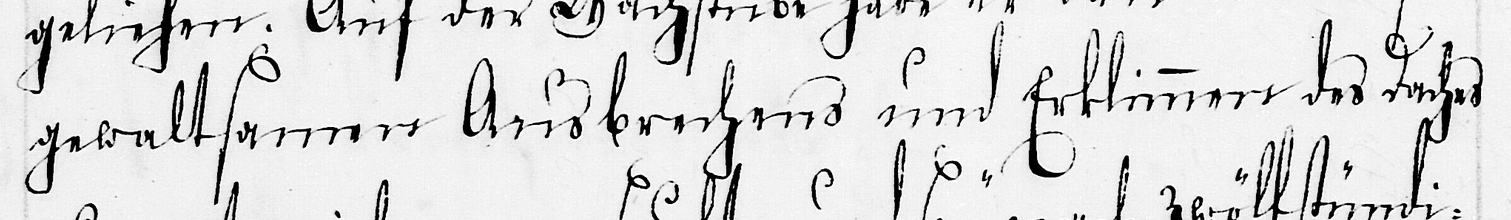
gewaltsamen Ausbrechens und Erklimmen des Dach¬
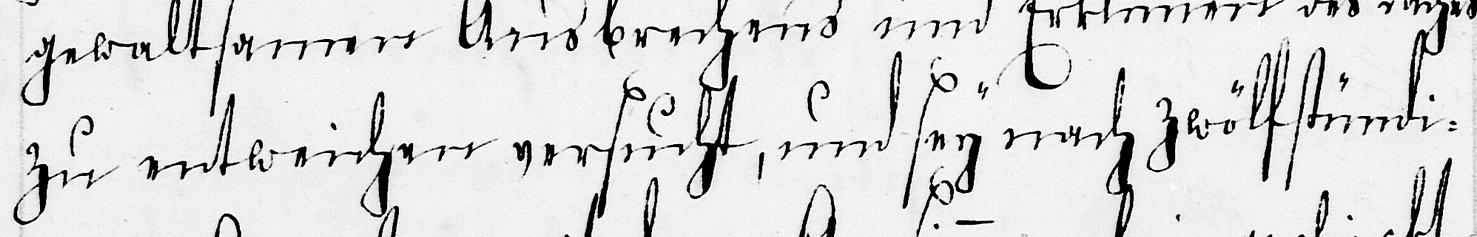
zu entweichen versucht, und sey nach zwölfstündi¬
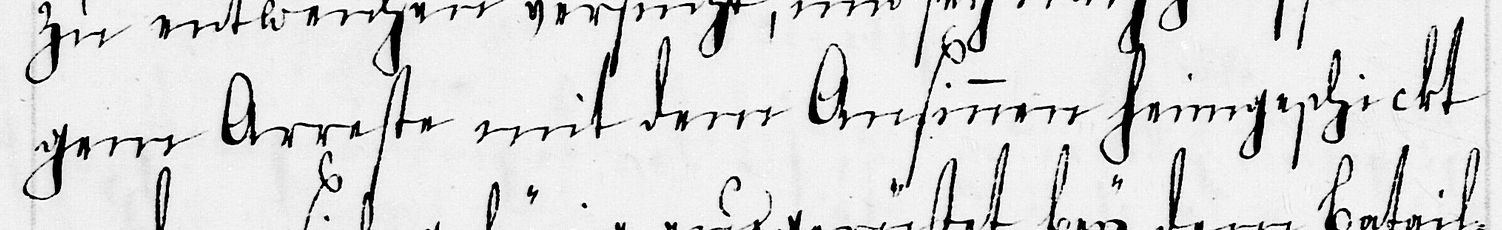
gem Arreste mit dem Ansinnen heimgeschickt
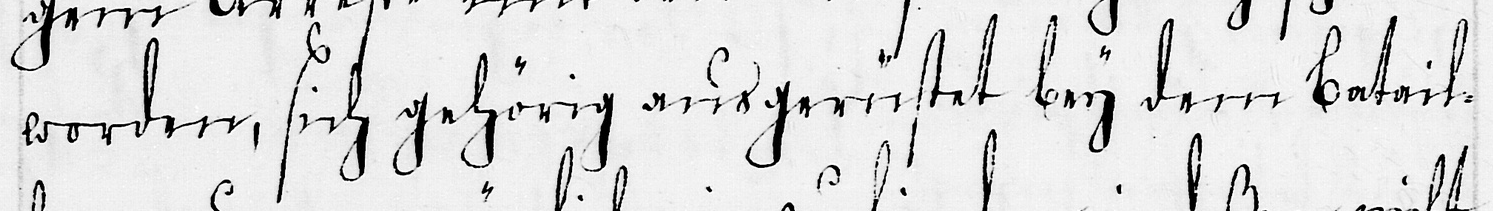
worden, sich gehörig ausgerüstet bey dem Batail¬
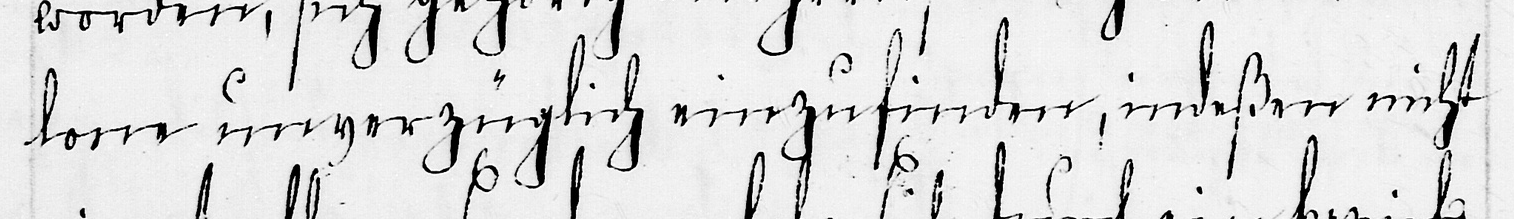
lone unverzüglich einzufinden, indeßen nicht
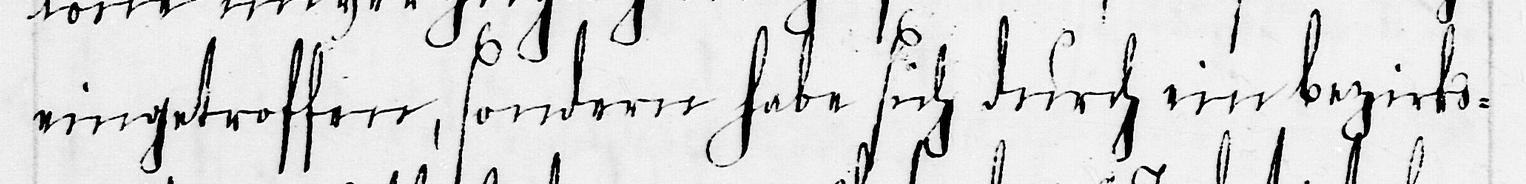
eingetroffen, sondern habe sich durch ein bezirks¬
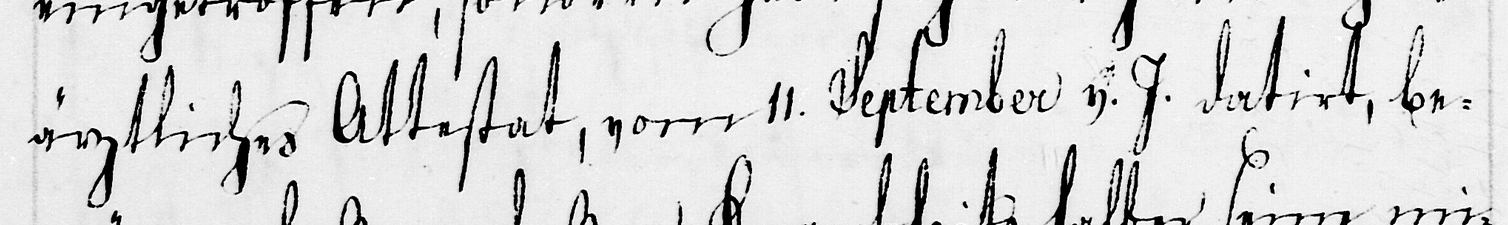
ärztliches Attestat, vom 11. September v. J. datirt, be¬
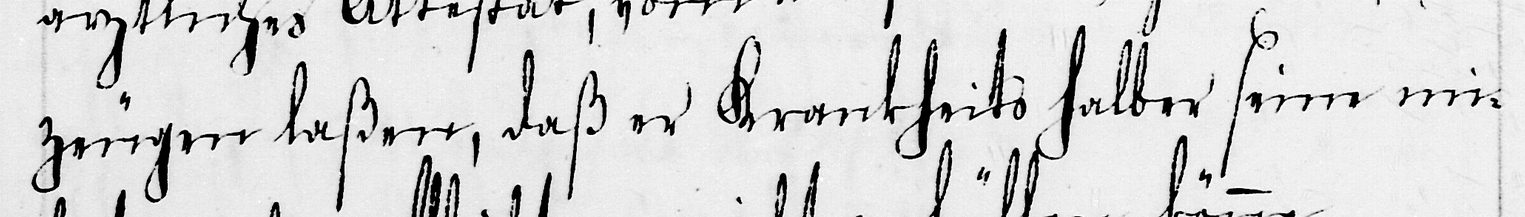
zeugen laßen, daß er Krankheits halber seine mi¬
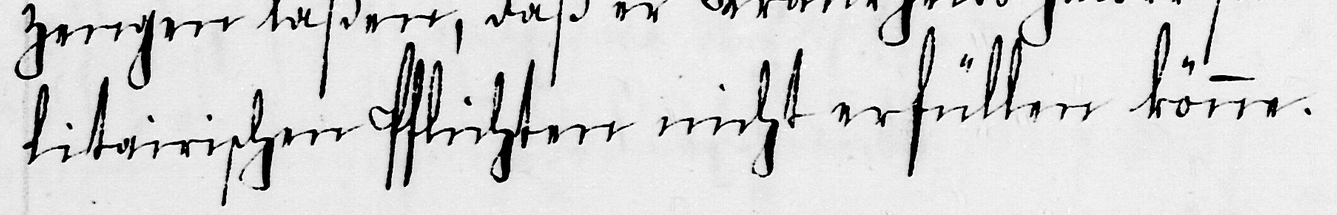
litairischen Pflichten nicht erfüllen könne.
